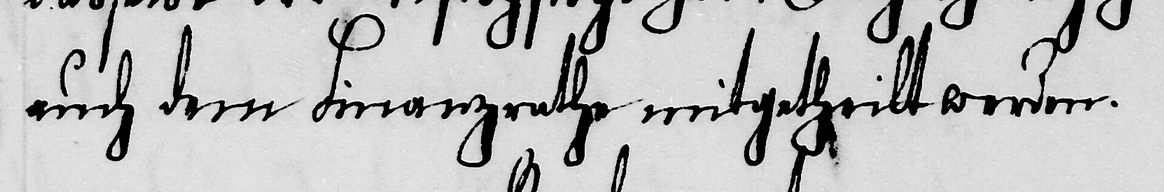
auch dem Finanzrathe mitgetheilt werden.
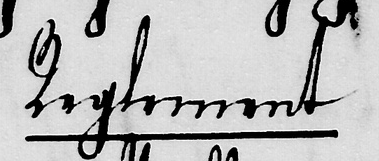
Reglement
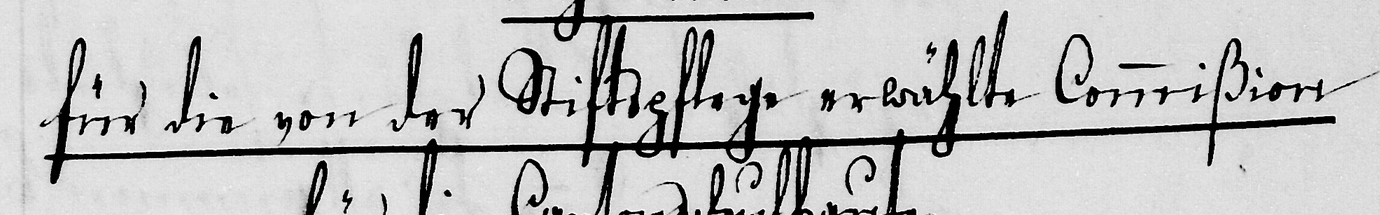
für die von der Stiftspflege erwählte Commißion
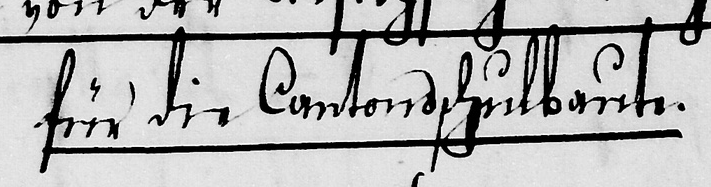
für die Cantonsschulbaute.
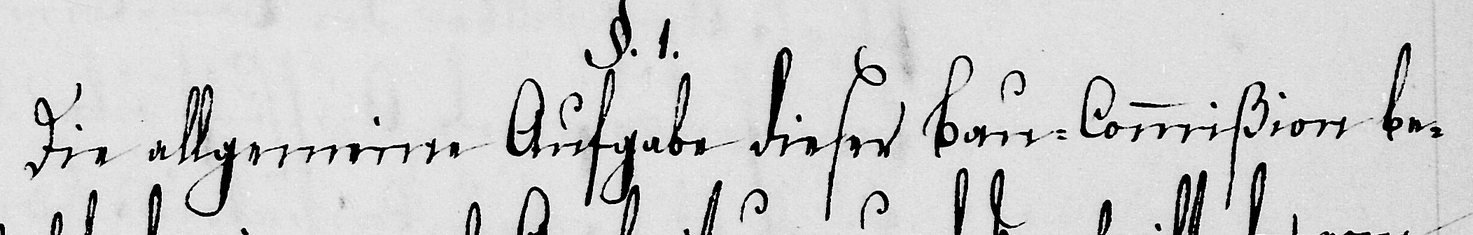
Die allgemeine Aufgabe dieser Bau-Commißion be¬
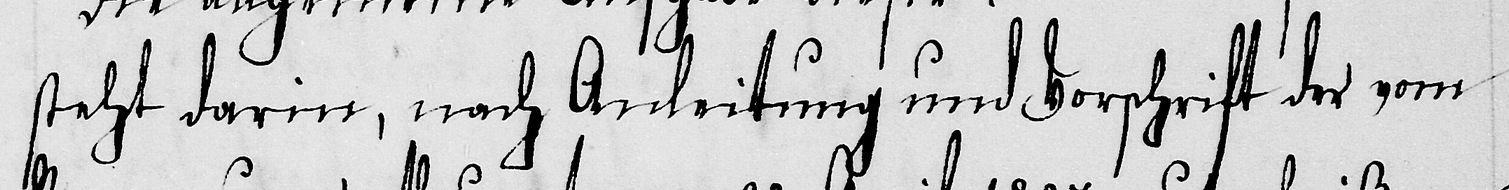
steht darin, nach Anleitung und Vorschrift vom
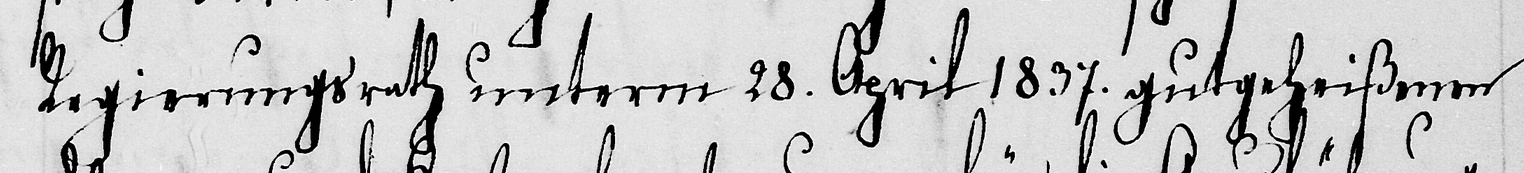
Regierungsrath unterm 28. April 1837. gutgeheißenen
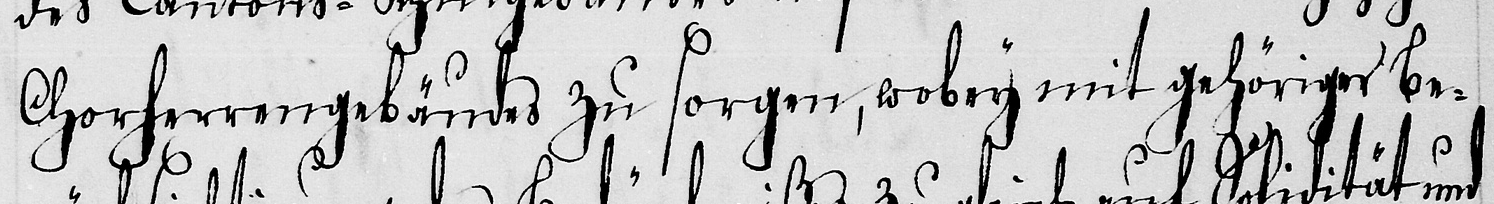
Chorherrengebäudes zu sorgen, wobey mit gehöriger Be¬
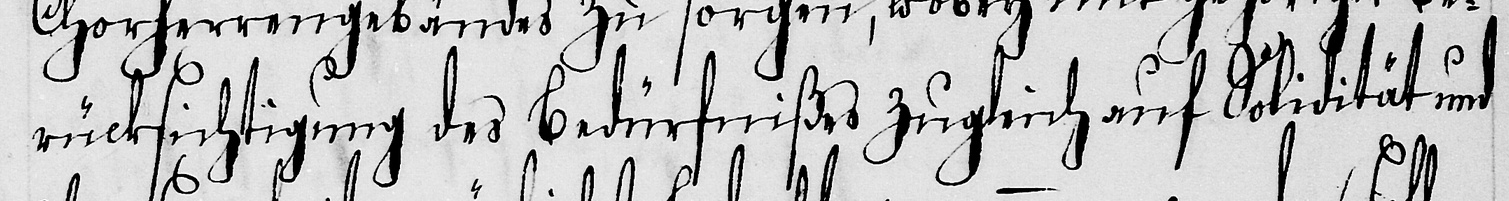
rücksichtigung des Bedürfnißes zugleich auf Solidität und
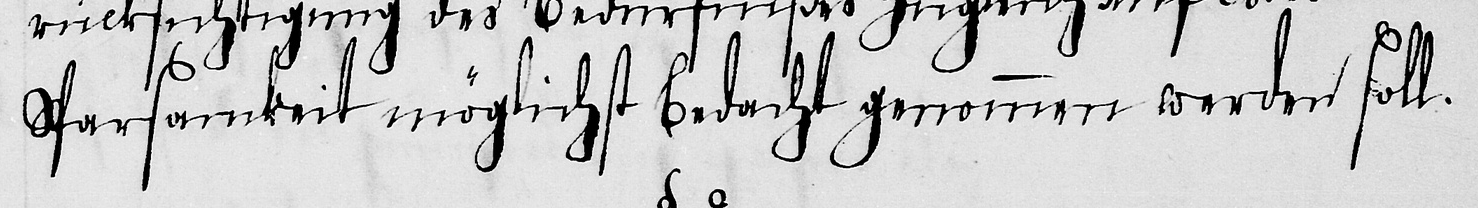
Sparsamkeit möglichst Bedacht genommen werden soll.
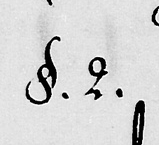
§.2.
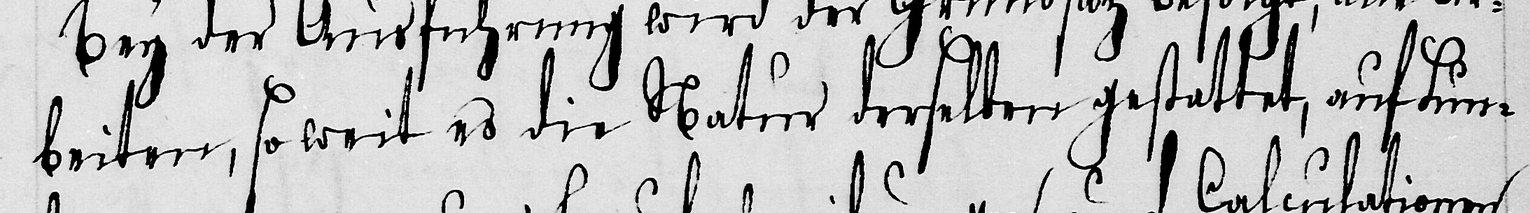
beiten, soweit es die Natur derselben gestattet, auf Fun¬
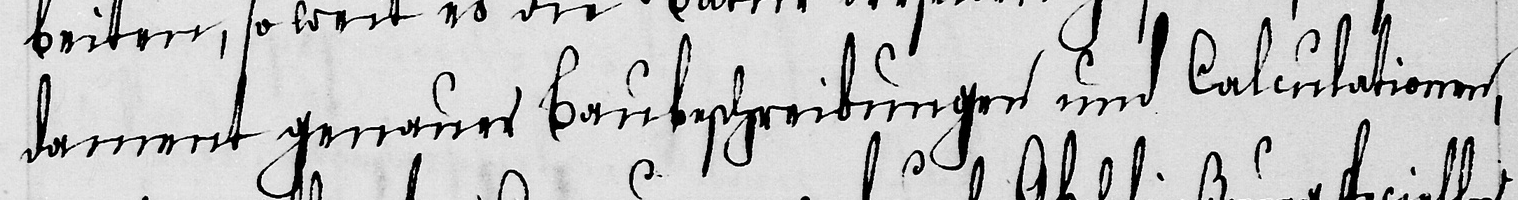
dament genauer Baubeschreibungen und Calculatione¬
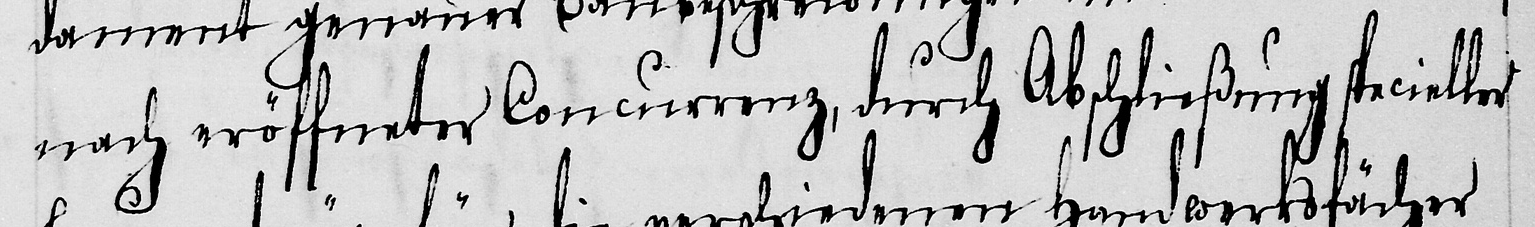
nach eröffneter Concurrenz, durch Abschließung speciel¬
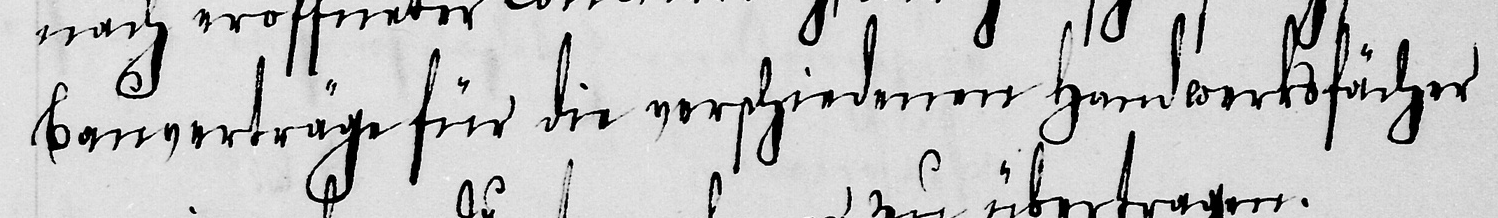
Bauverträge für die verschiedenen Handwerksfächer
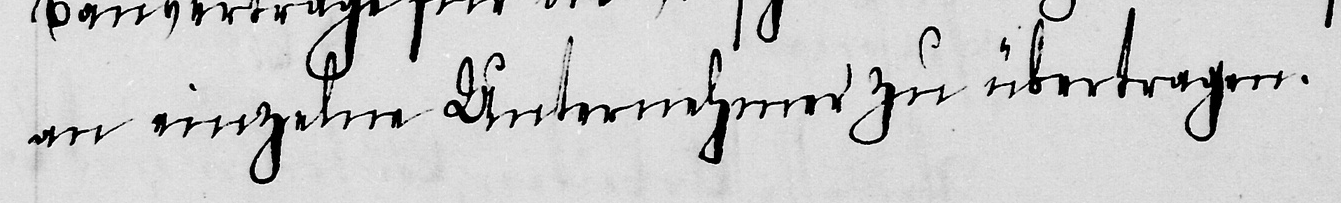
an einzelne Unternehmen zu übertragen.
